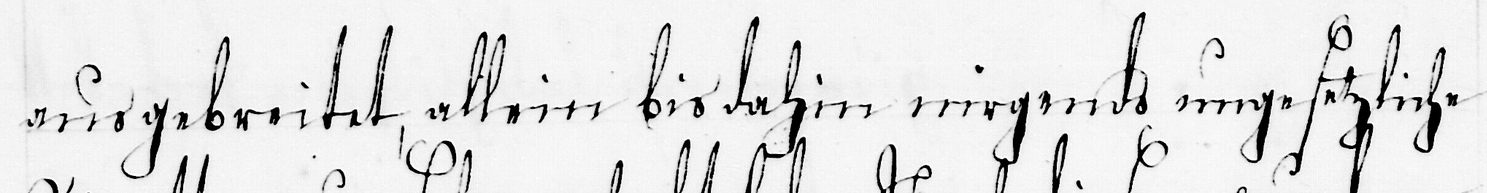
ausgebreitet, allein bis dahin nirgends ungesetzliche
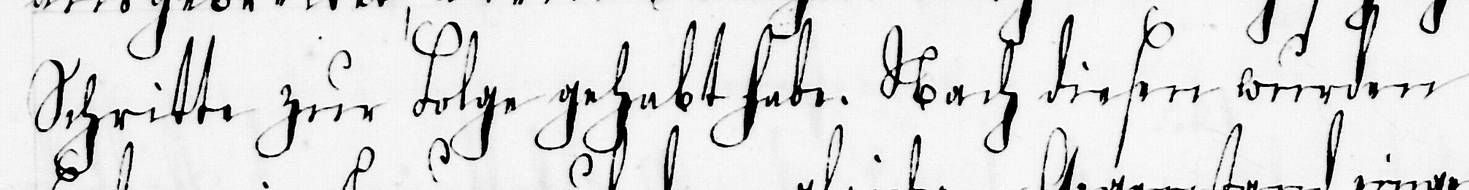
Schritte zur Folge gehabt habe. Nach diesen wurden
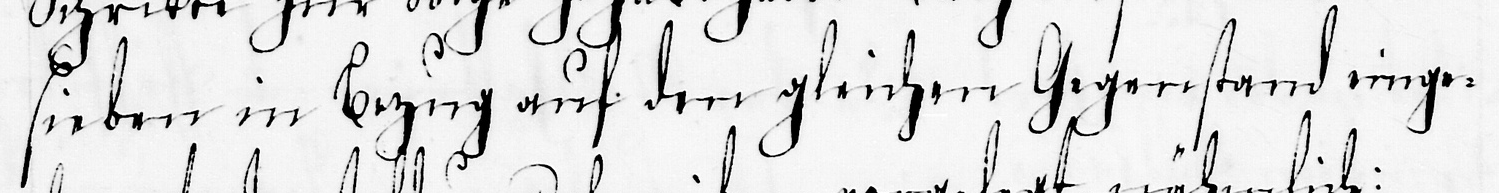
sieben in Bezug auf den gleichen Gegenstand einge¬
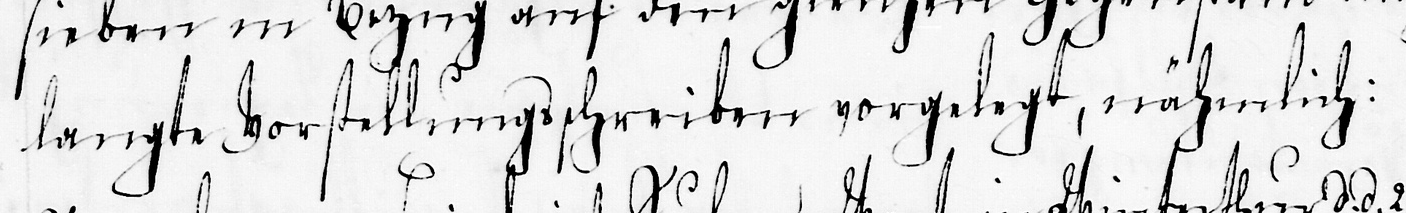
langte Vorstellungsschreiben vorgelegt, nähmlich:
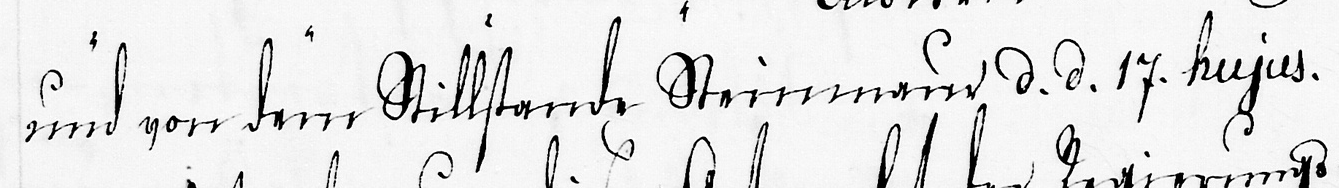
und von dem Stillstande Steinmaur d. d. 17. hujus.
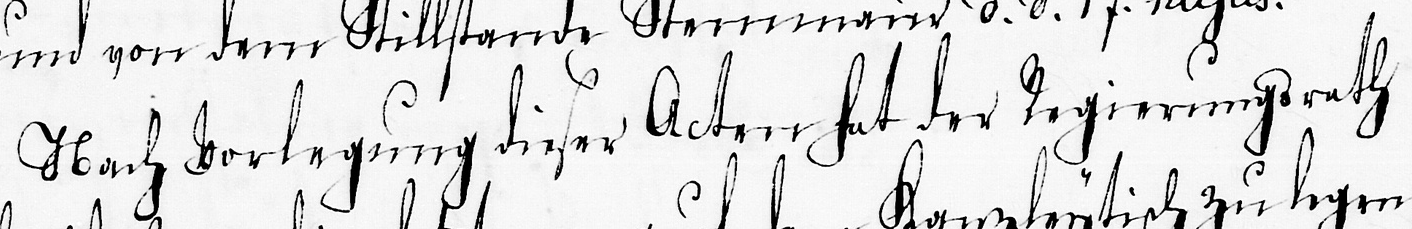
Nach Vorlegung dieser Acten hat der Regierungsrath
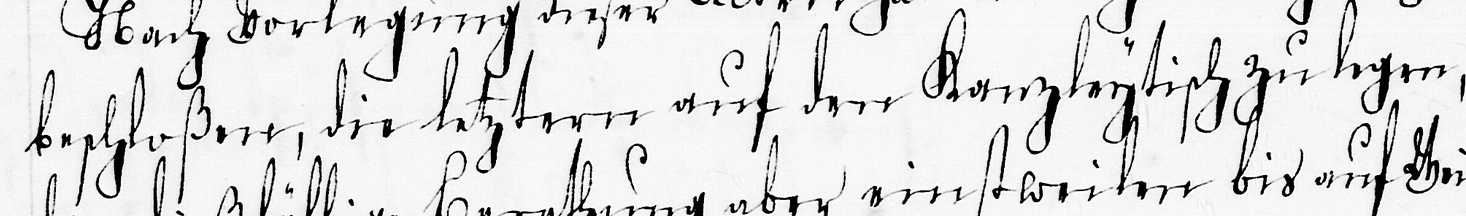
beschloßen, die letztern auf den Kanzleytisch zu legen,
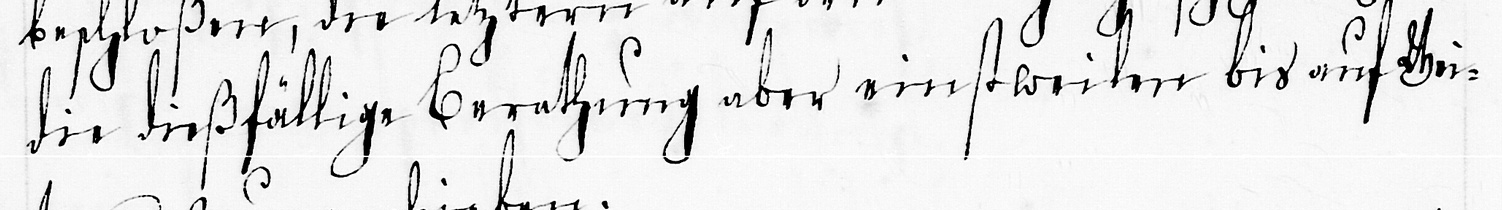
die dießfällige Berathung aber einstweilen bis auf Wei¬
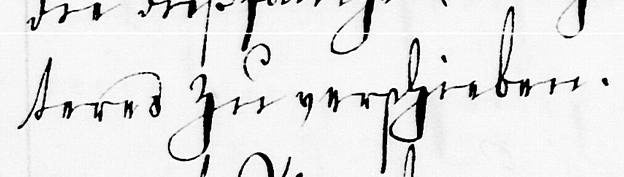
teres zu verschieben.
